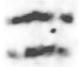二
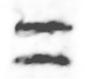二
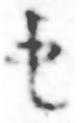屯
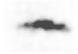一
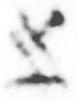之
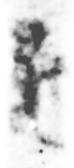○（豻）
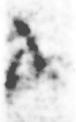尾
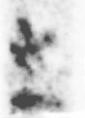之
